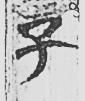子
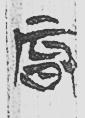晨
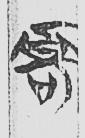{口甹}
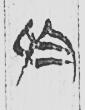於
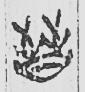晉
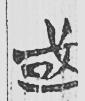或
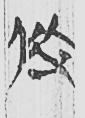攸
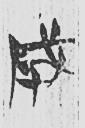成
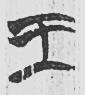王
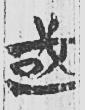或
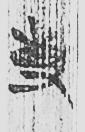史
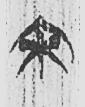宋
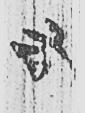右
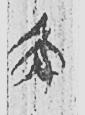帀
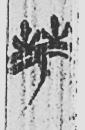芋
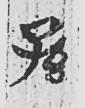孫
